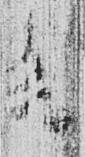弓
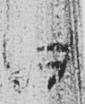曰
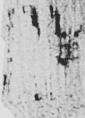敢
